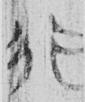行
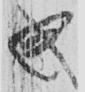母
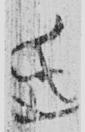○（眡）
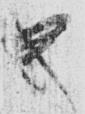母
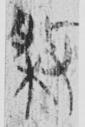○（摇）
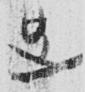足
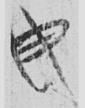母
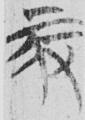○（偏）
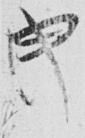母
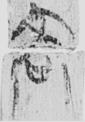高
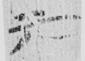亓（其）
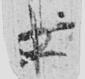才（在）
